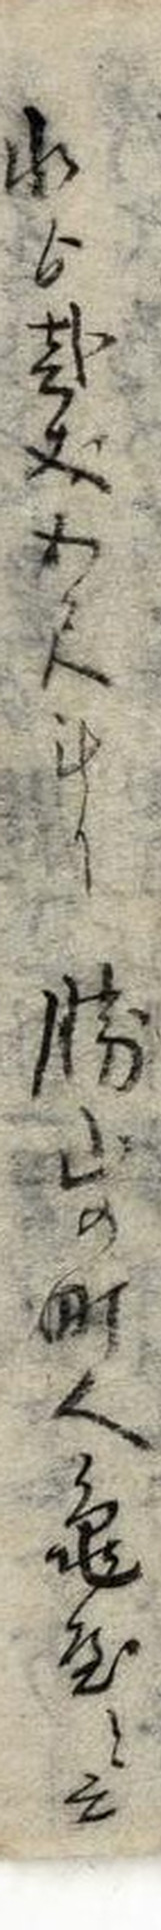水ゟ弐丈五尺斗り勝山の町人亀屋と云

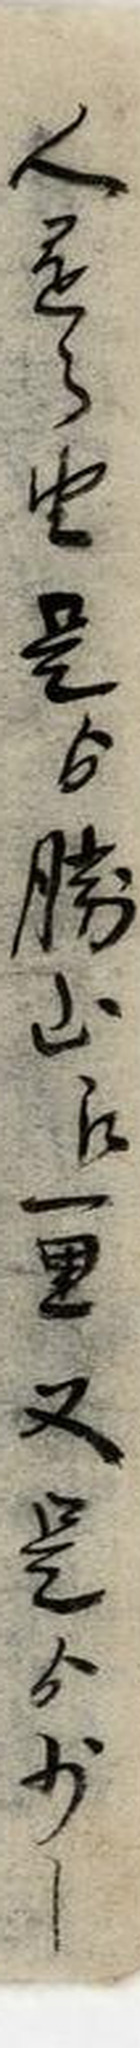人ら由是ゟ勝山江一里又是ゟ少し
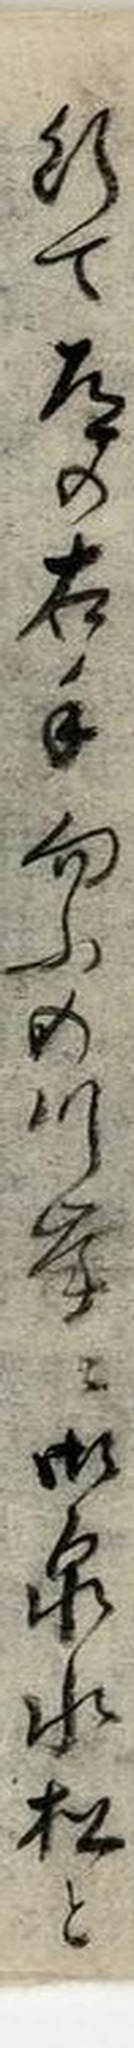行て屋の右手向ふの川岸ニ御泉水松と
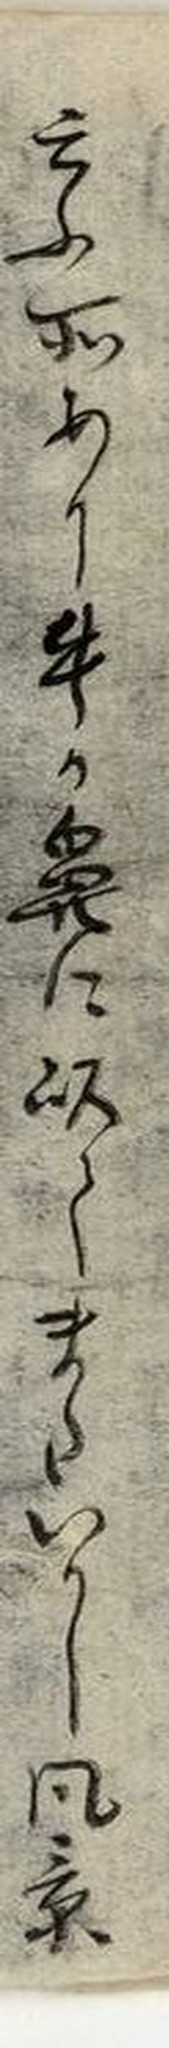云ふ所あり牛の鼻にまたいりし風景
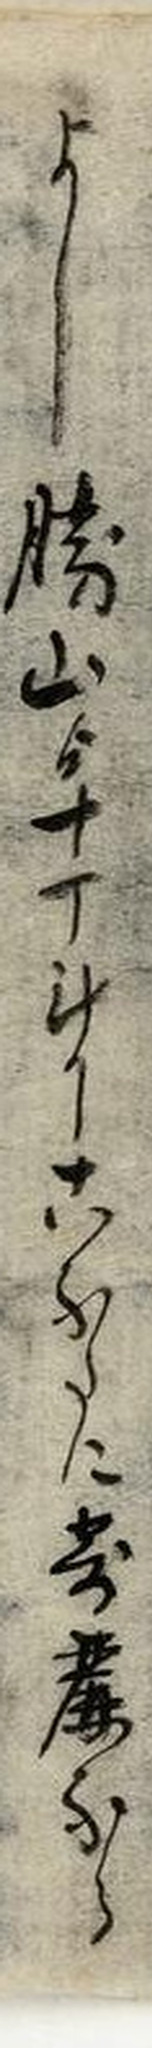よし勝山ゟ十丁斗りこなたに寄麓なる
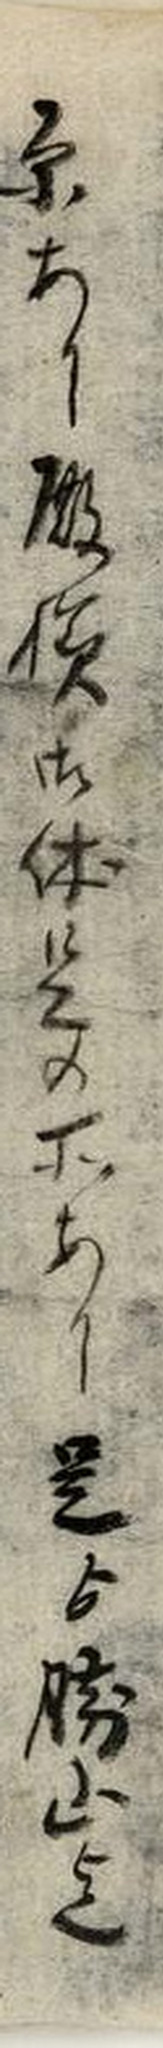原あり殿様御休是の所あり是ゟ勝山迄
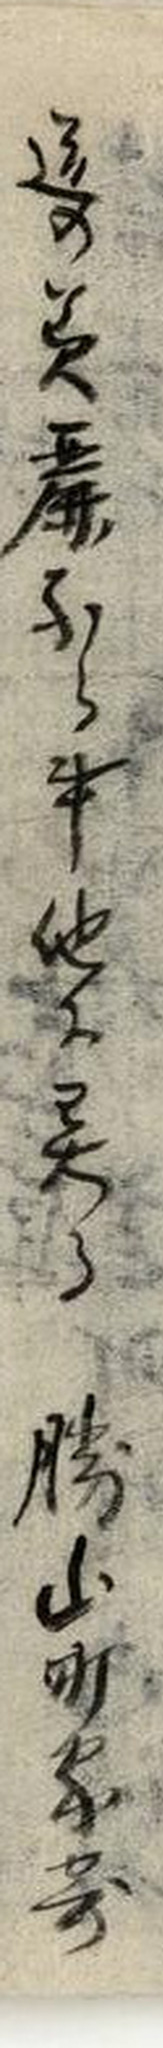道の美簾なる事他に異る勝山町家寄
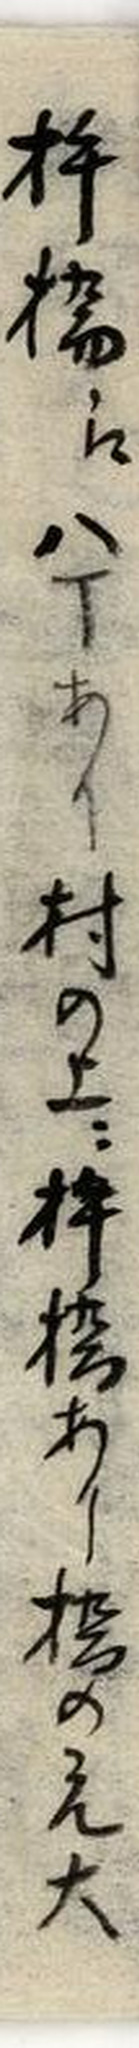杵橋江八丁あり村の上ニ杵橋あり橋の元大
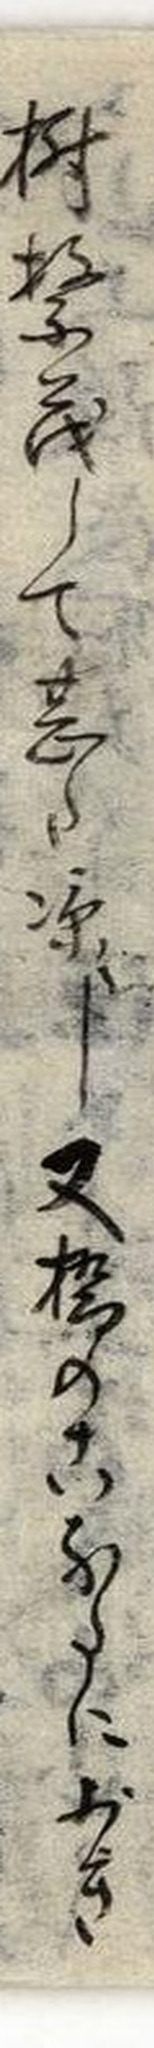樹繫茂して甚だ涼し又橋のこなたに
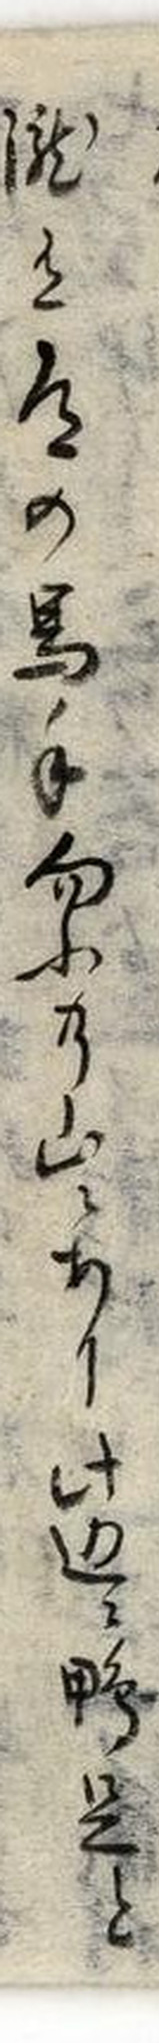瀧有道の馬手向ふ乃山ニあり此辺ニ鴨足と
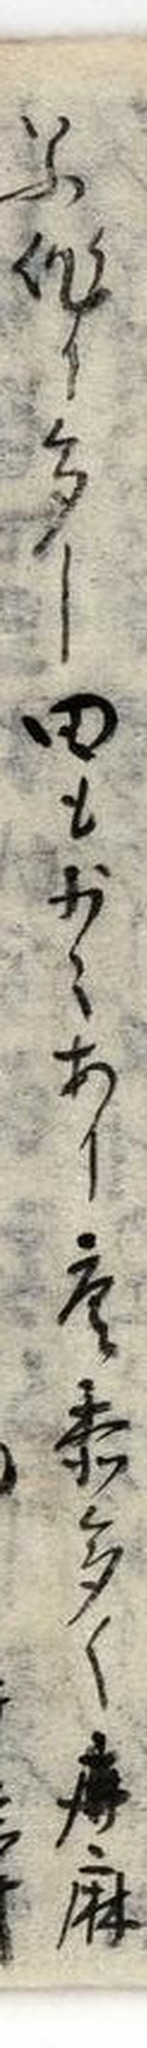いふ作り多し田も少〃あり唐黍多く麻
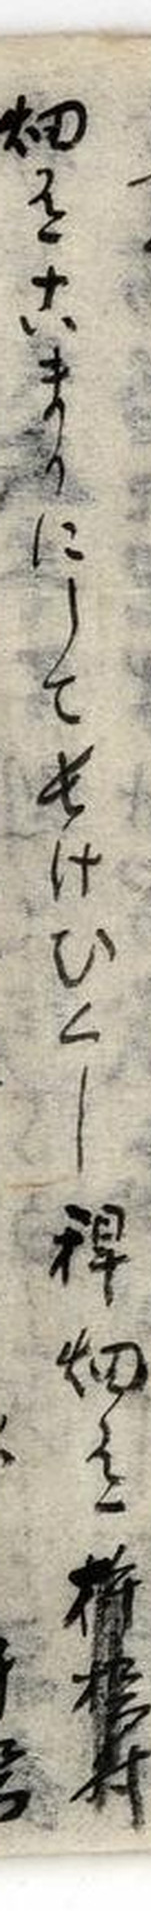畑有こまかにして長さひくし稗畑有
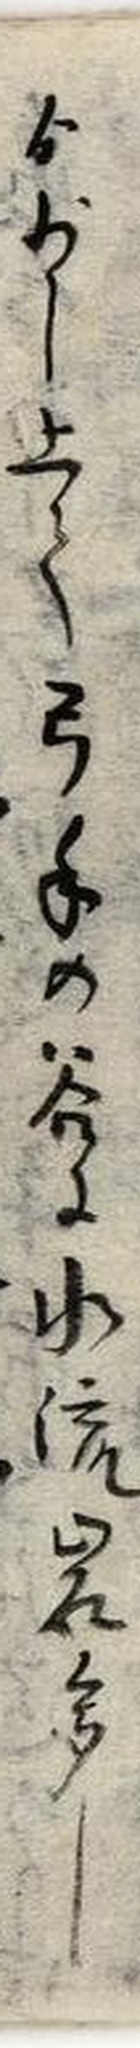ゟ少し上て弓手の谷に水流岩お多し
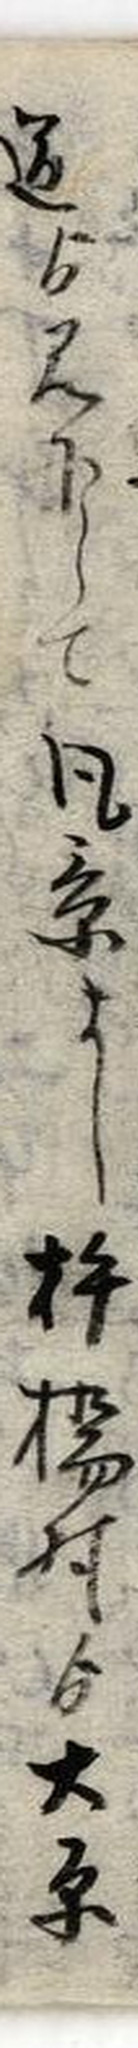道より見下して風景よし杵橋村ゟ大原
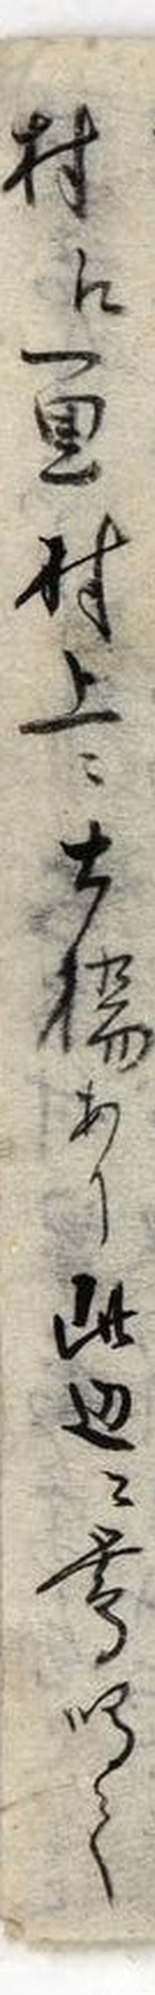村江一里村上ニ土橋あり此辺ニ鶯鳴く

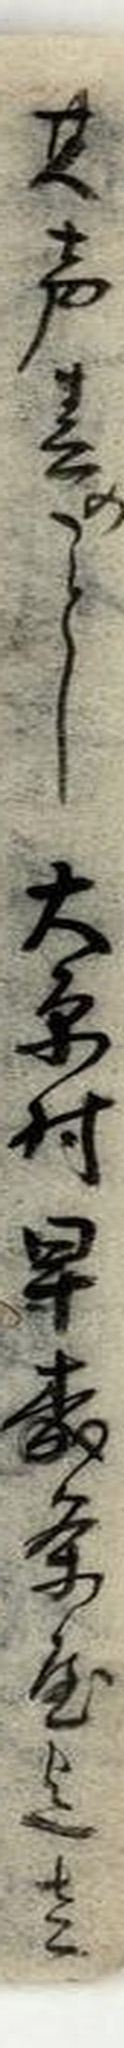其声春のことし大原村早森茶屋迄壱
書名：白山道中名所筆記（旅日記）
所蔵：福井県文書館 Fukui Prefectural Archives
